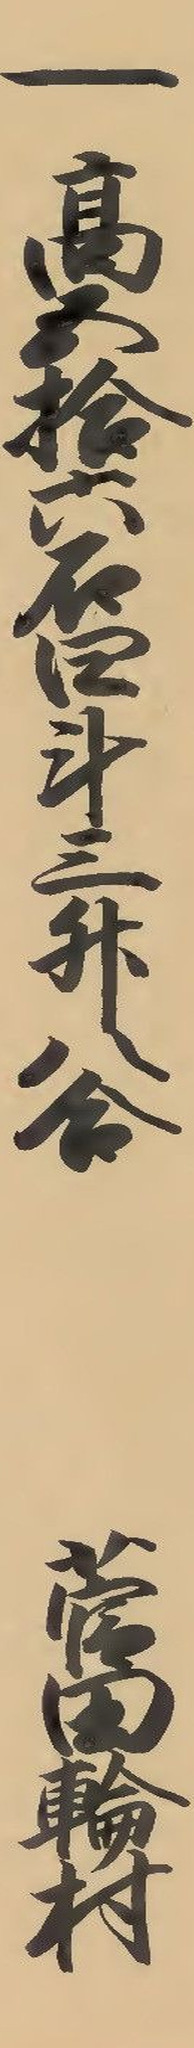一高五拾六石四斗三升八合菅田輪村
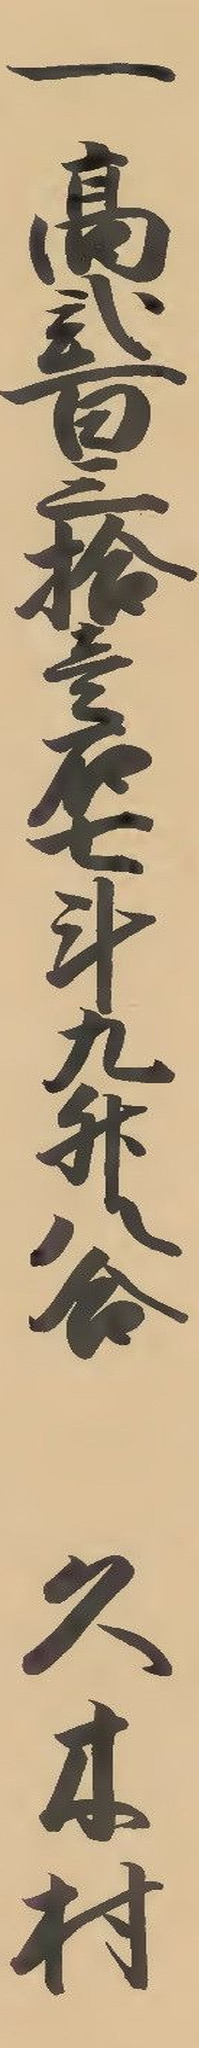一高弐百三拾壱石七斗九升八合久木村
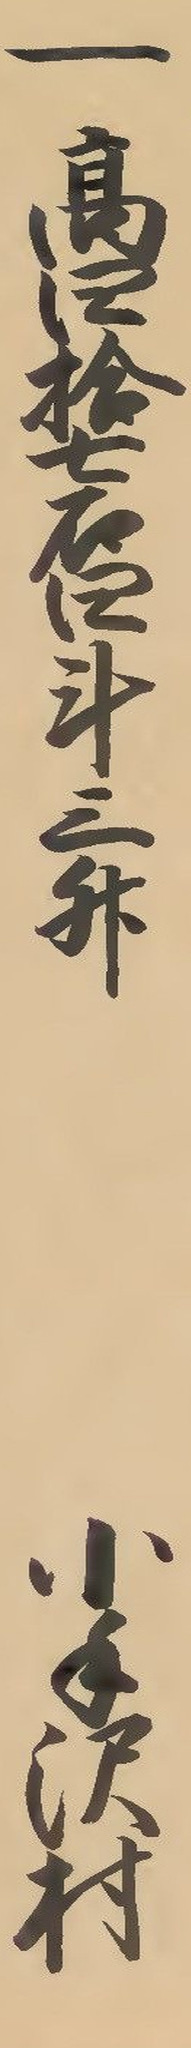一高四拾七石四斗三升小手沢村

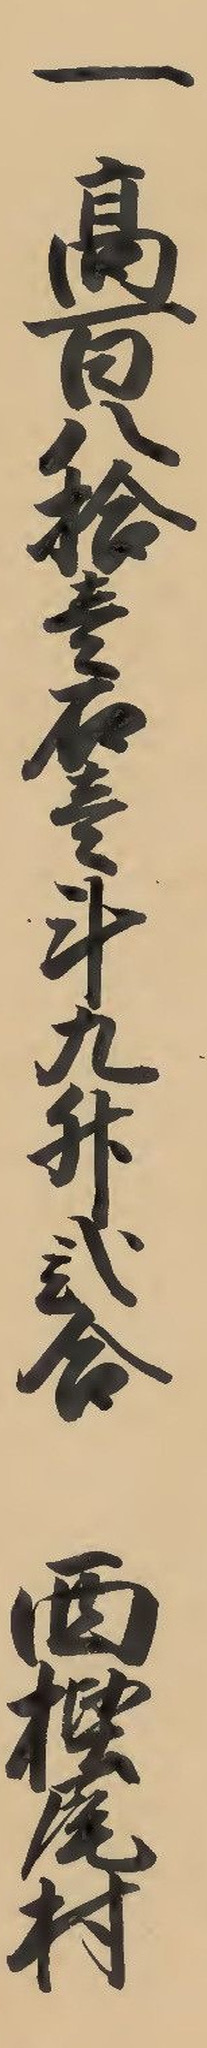一高百八拾壱石壱斗九升弐合西樫尾村
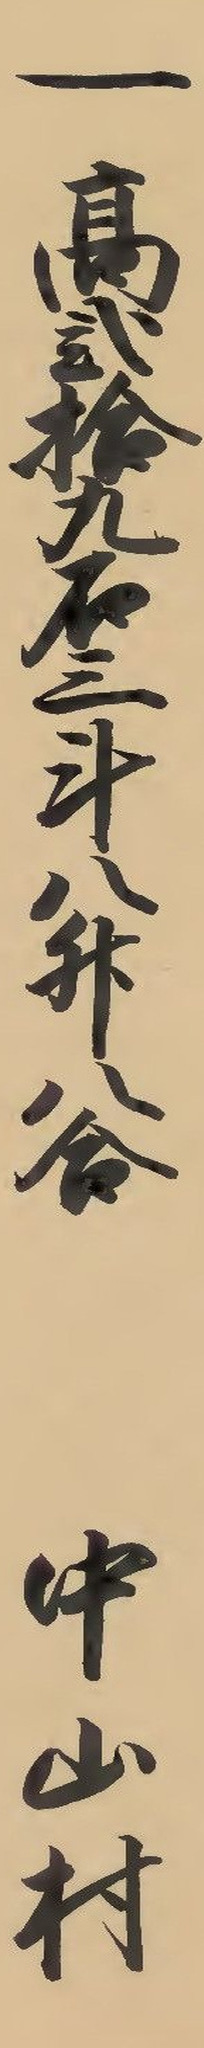一高弐拾九石三斗八升八合中山村
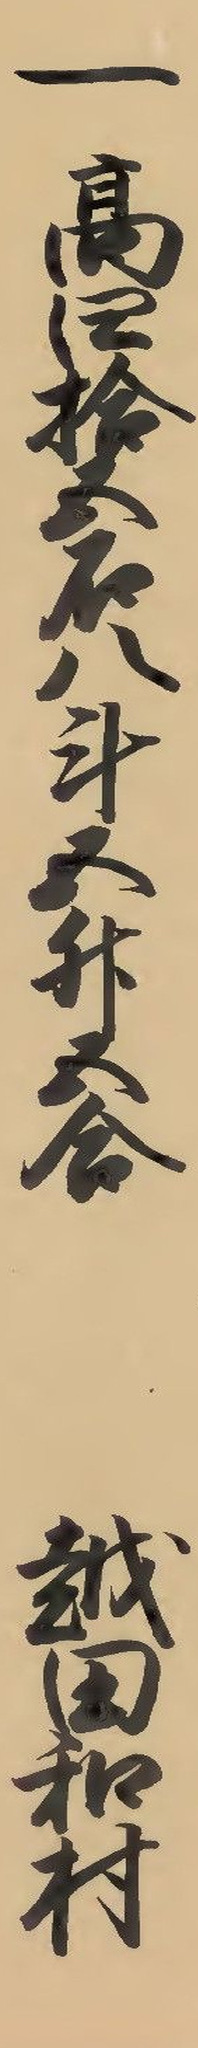一高四拾五石八斗五升五合越田和村
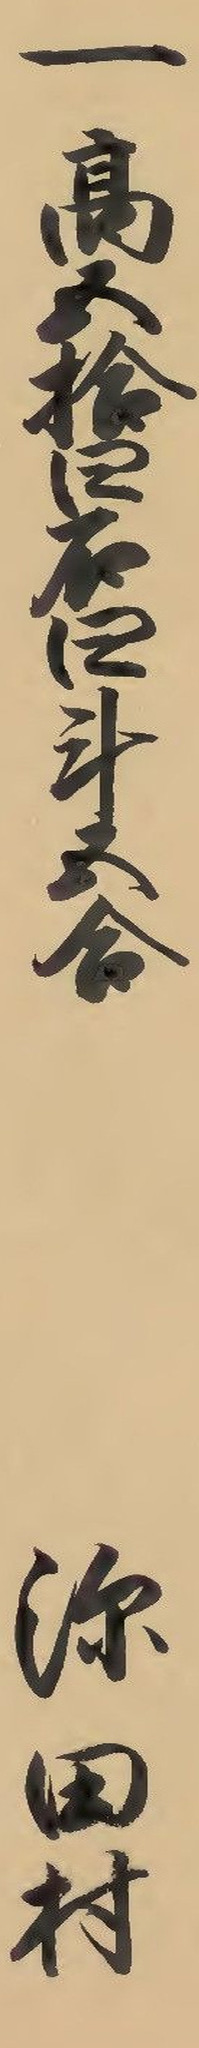一高五拾四石四斗五合深田村
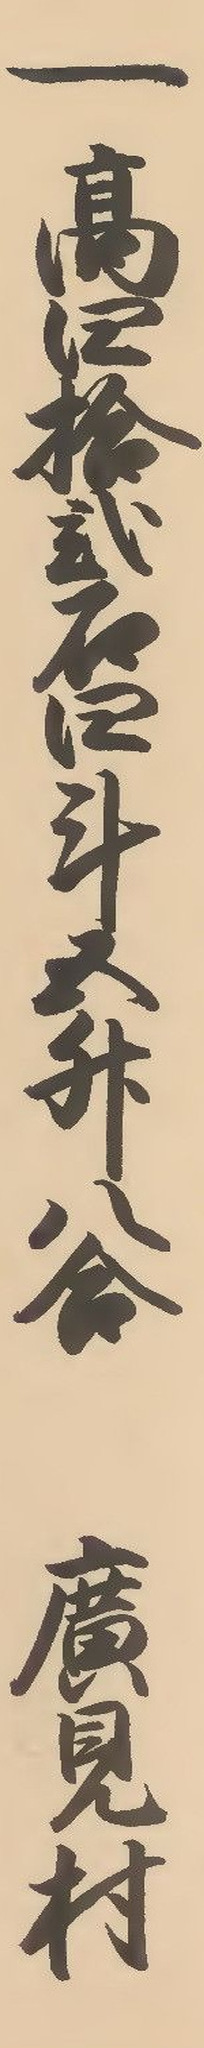一高四拾弐石四斗五升八合広見村
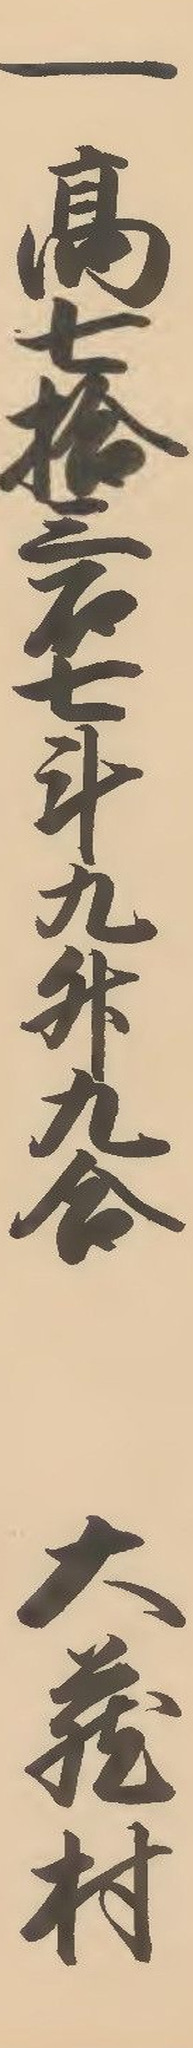一高七拾三石七斗九升九合大蔵村
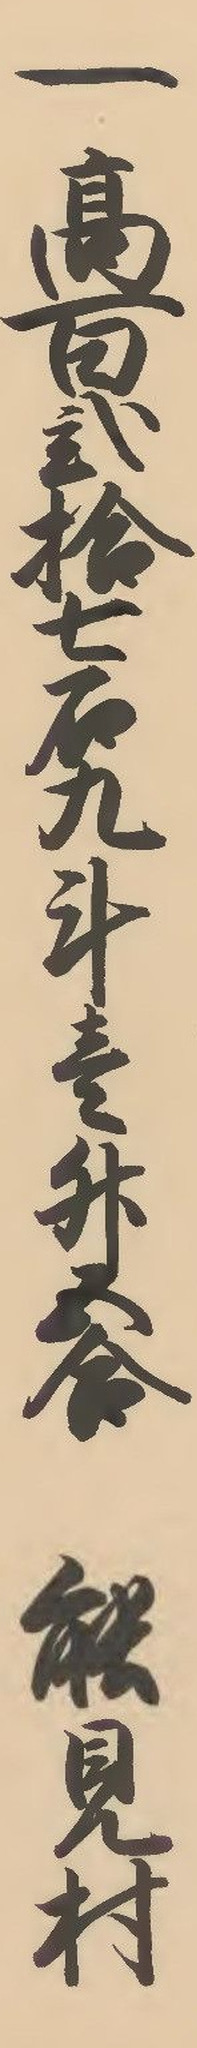一高百弐拾七石九斗壱升五合能見村

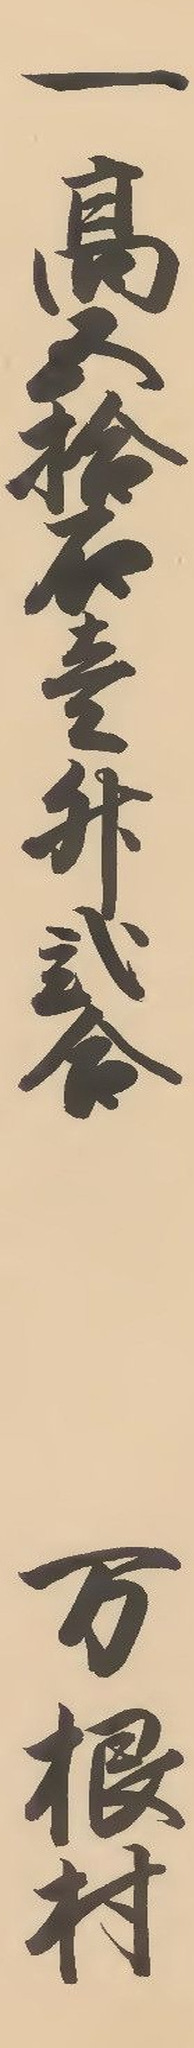一高五拾石壱升弐合万根村
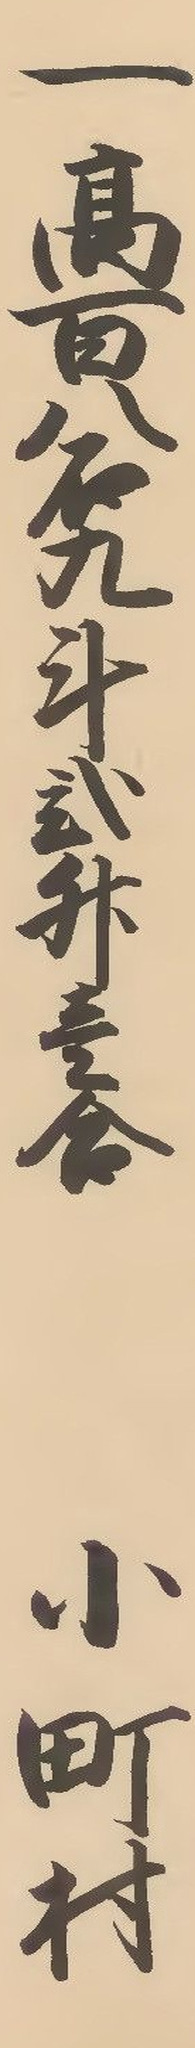一高百八石九斗弐升壱合小町村
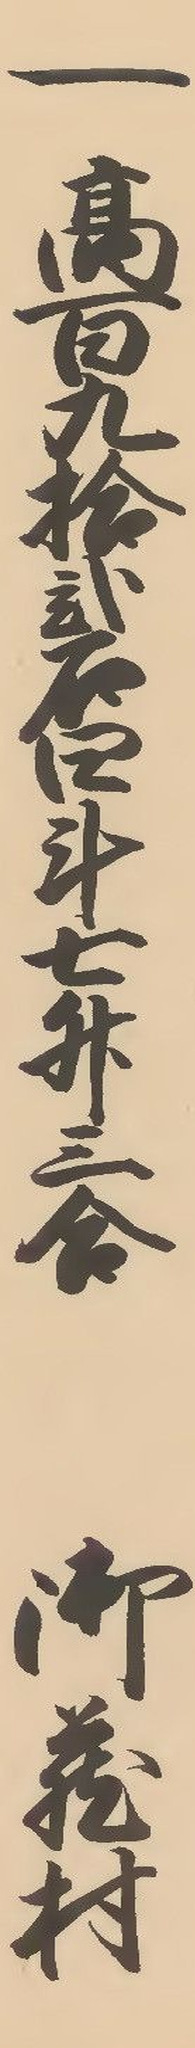一高百九拾弐石四斗七升三合御蔵村
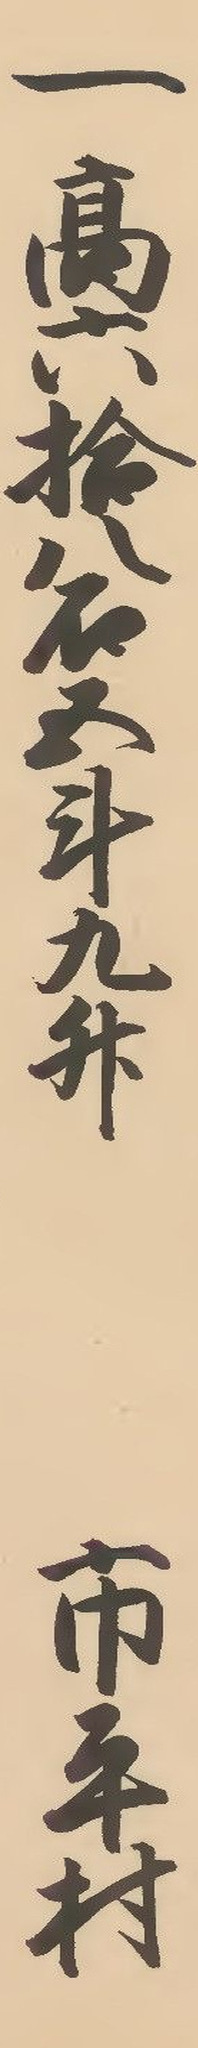一高六拾八石五斗九升市平村
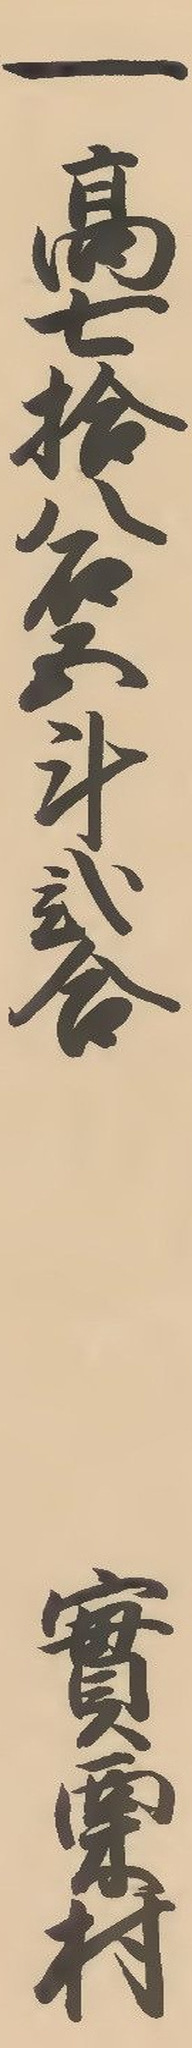一高七拾八石五斗弐合実栗村
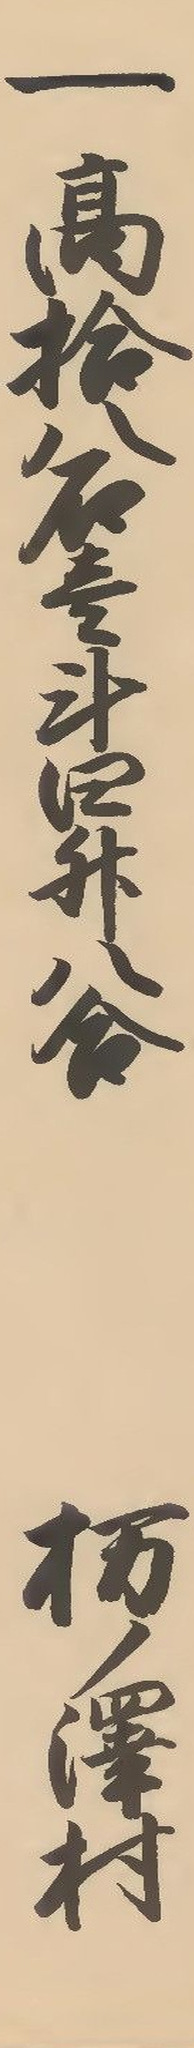一高拾八石壱斗四升八合栃ノ沢村
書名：三河国郷帳
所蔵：国立公文書館 National Archives of Japan
